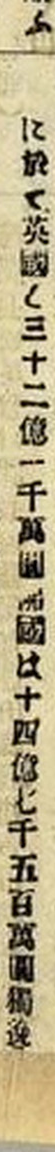に於て英国は三十二億一千万円仏国は十四億七千五百万円独逸
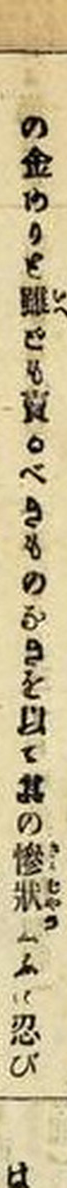の金ありと雖ども売るべきものなきを以て其の惨状云ふに忍び
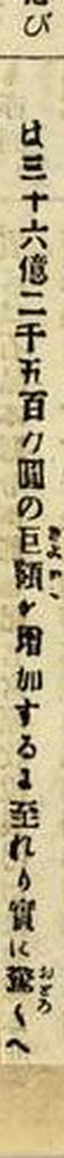は三十六億二千五百万円の巨額を増加するに至れり実に驚くへ
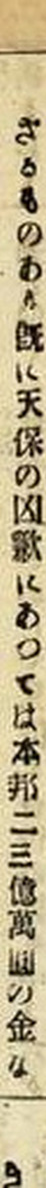ざるものあり既に天保の凶歉にあつては本邦ニ三億万円の金な
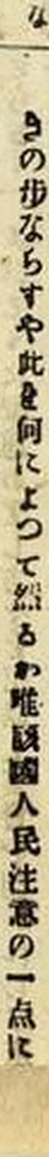きの歩ならすや此れ何によつて然るか唯該国人民注意の一点に
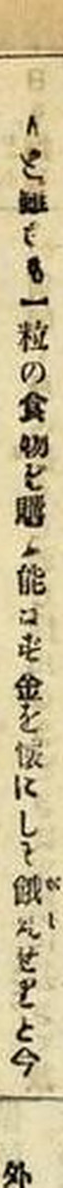りと雖とも一粒の食物を購ふ能はず金を懐にして餓死せりと今
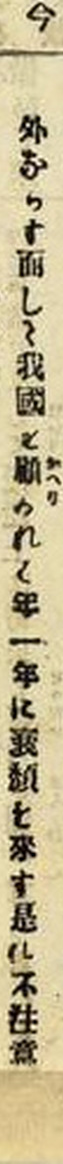外ならす而して我国を顧みれは年一年に衰頽を来す是れ不注意
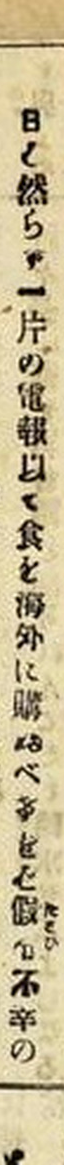日は然らず一片の電報以て食を海外に購ふべけれは假令不幸の
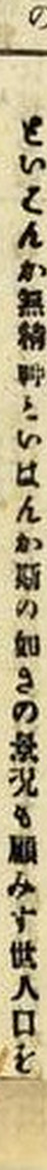といはんか無精神といはんか斯の如きの景況も顧みす世人口を
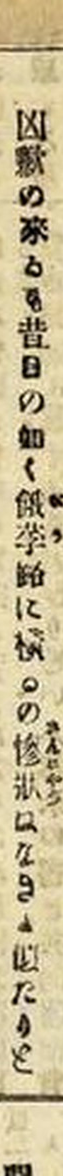凶歉の来るも昔日の如く餓莩路に横るの惨状はなきに似たりと
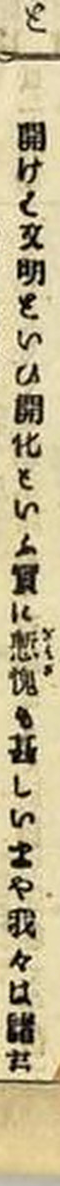開けは文明といひ開化といふ実に慙愧も甚しいまや我々は諸君
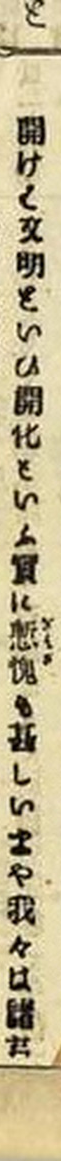開けは文明といひ開化といふ実に慙愧も甚しいまや我々は諸君
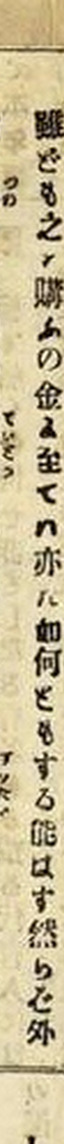雖ども之を購ふの金に至ては亦た如何ともする能はす然らば外
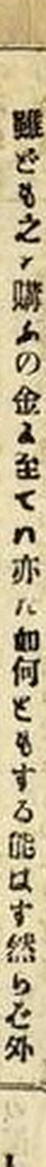雖ども之を購ふの金に至ては亦た如何ともする能はす然らば外
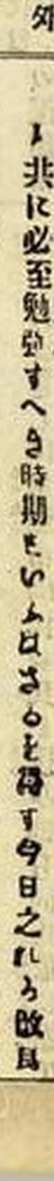も共に必至勉強すへき時期といふはさるを得す今日之れか改良
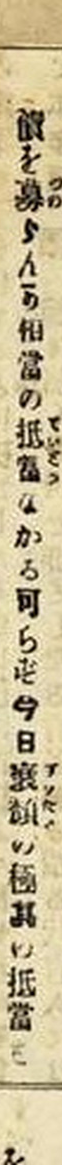債を募らんか相当の抵当なかる可らず今日衰頽の極其の抵当と
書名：温古集 五巻
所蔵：福井県文書館 Fukui Prefectural Archives
